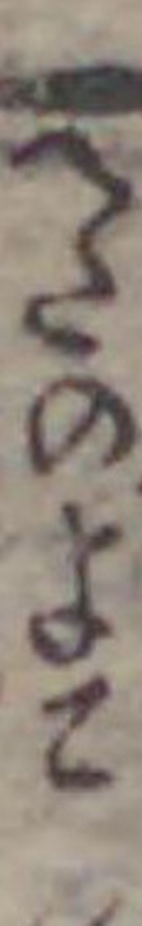へたのよこ
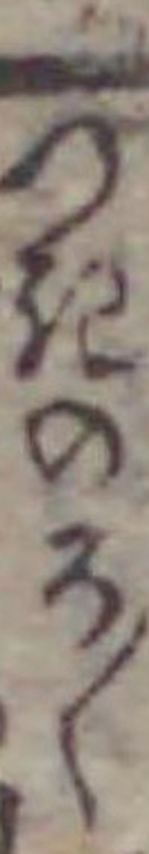つきのろ〳〵
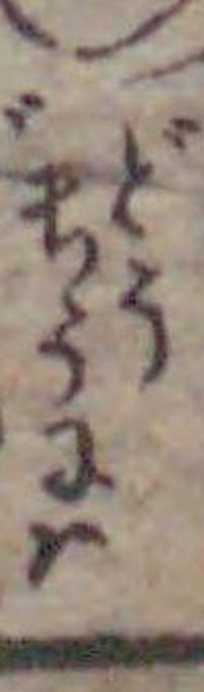ちうには
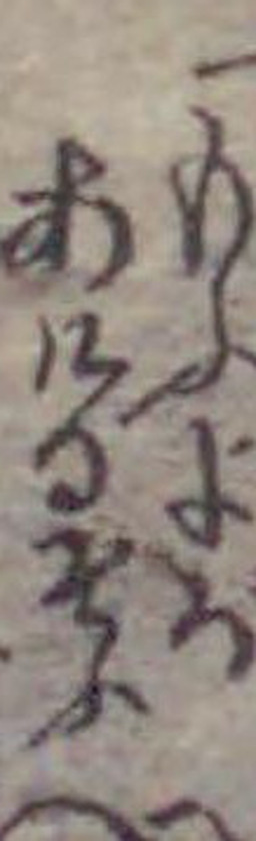あけるそふ
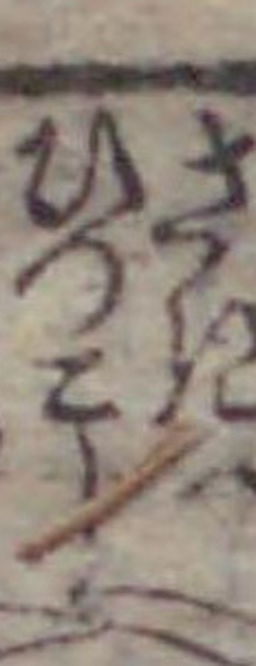ひつこして
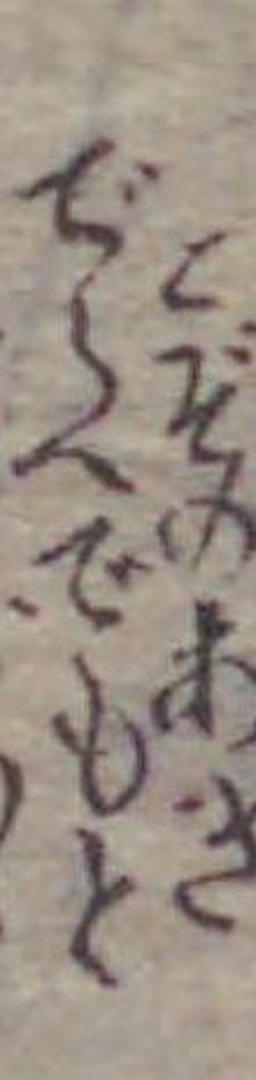でらへでもと
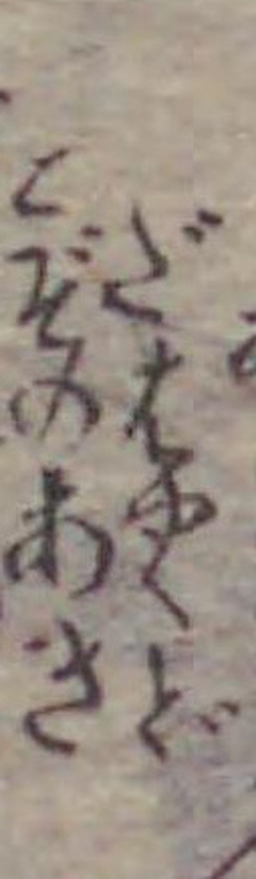こぞのあき
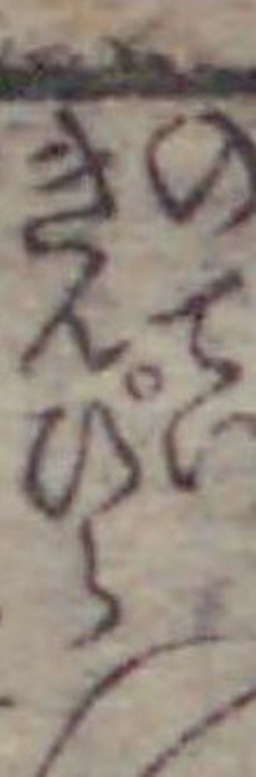きんぴら
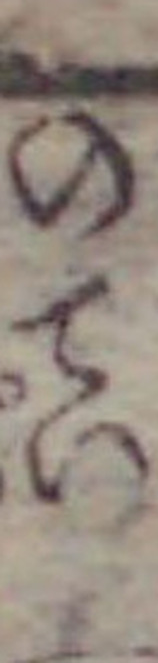のてい
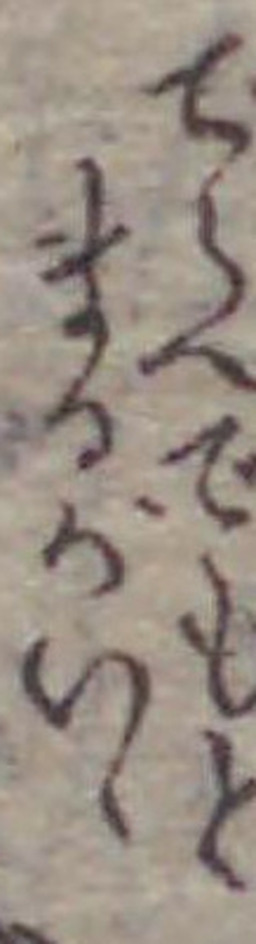まるがいゝ
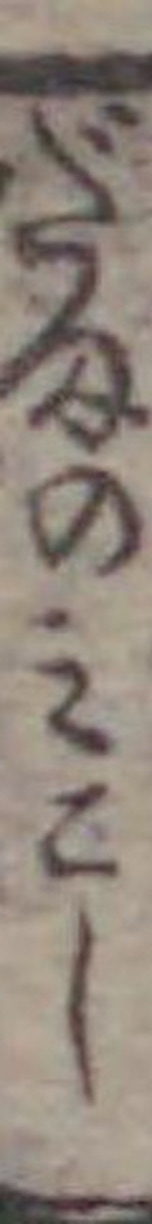だまのみこし
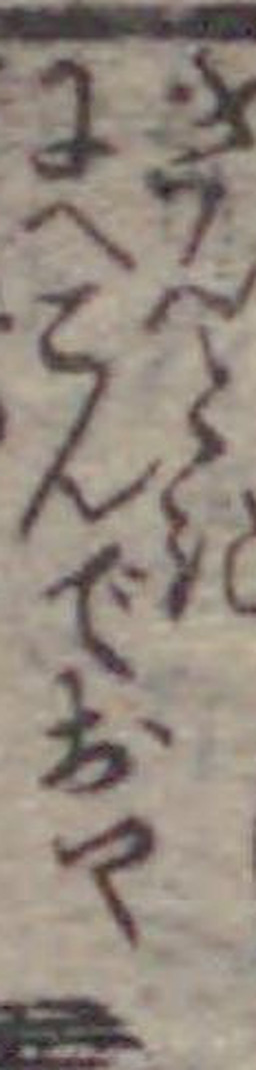にへこんでおや
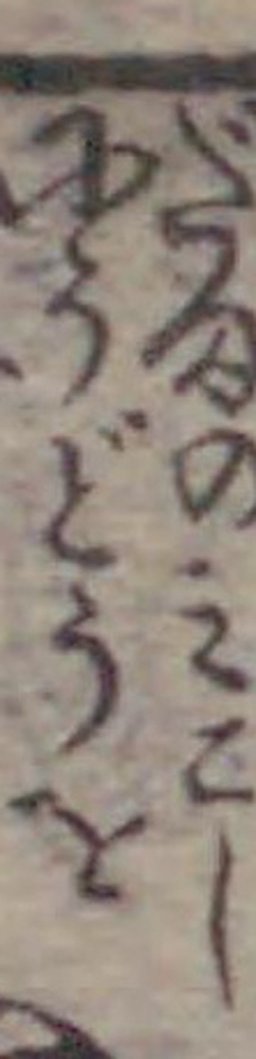にうどうを
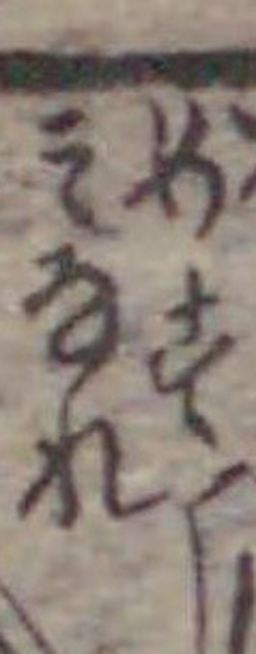みなれ
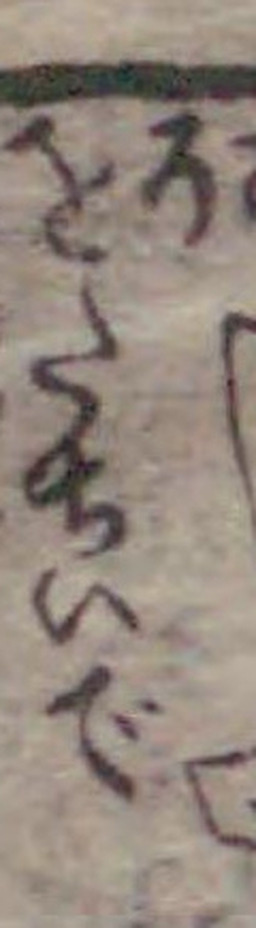をたちいで
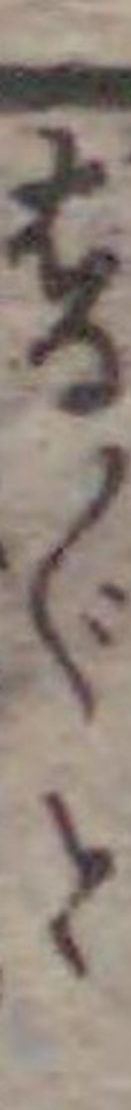はる〴〵と
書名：化物見世開 : 2巻
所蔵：国立国会図書館 National Diet Library, JAPAN
